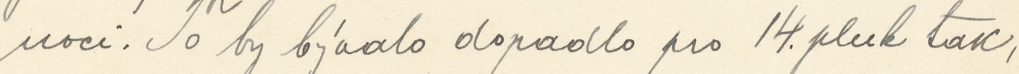noci. To by bývalo dopadlo pro 14. pluk tak,
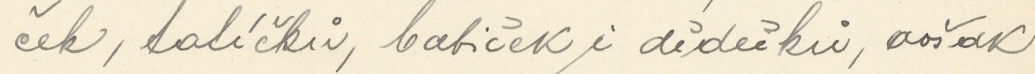ček, tatíčků, babiček i dědečků, avšak
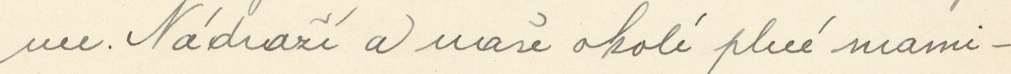me. Nádraží a naše okolí plné mami-
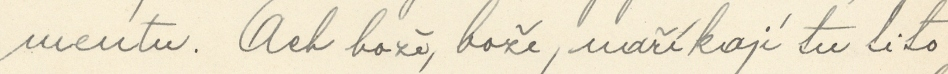mentu. Ach bože, bože, naříkají tu tito,
